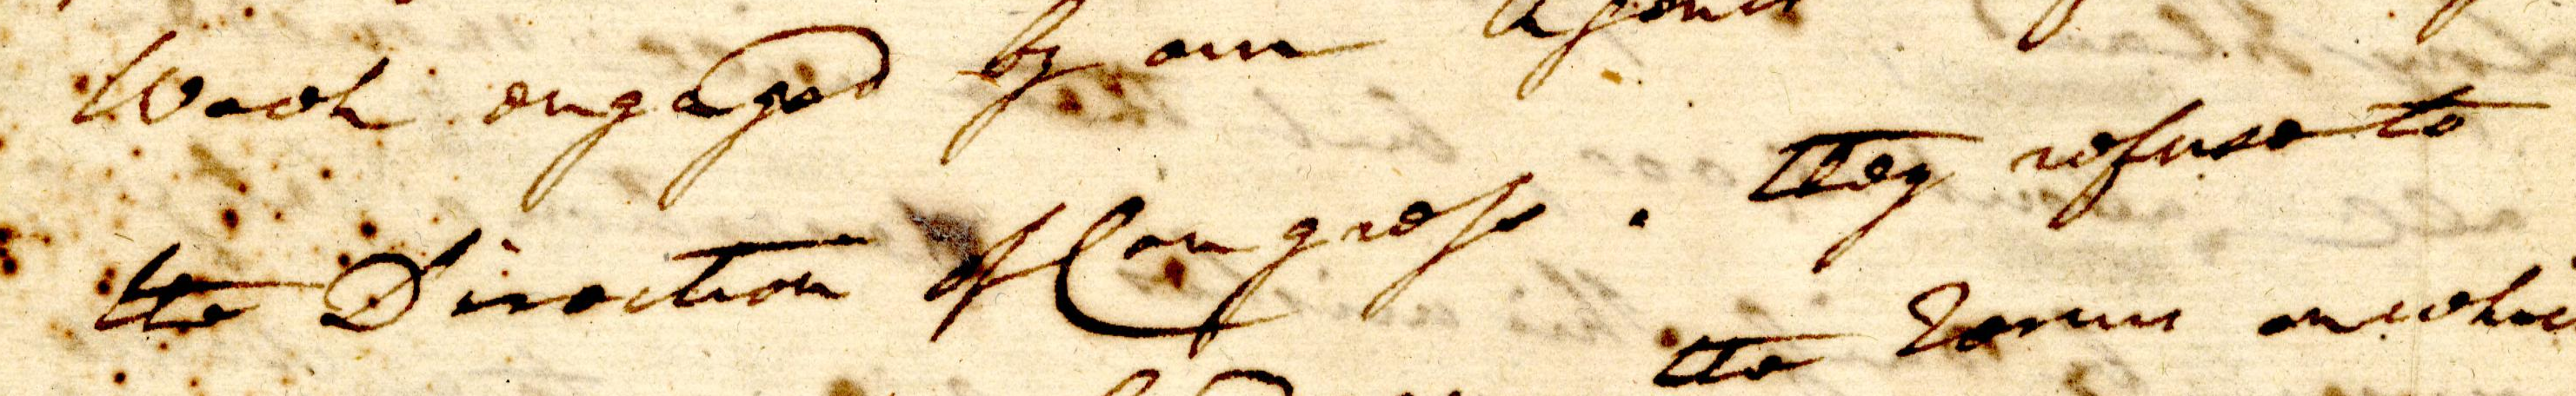the Direction of Congress. They refuse to
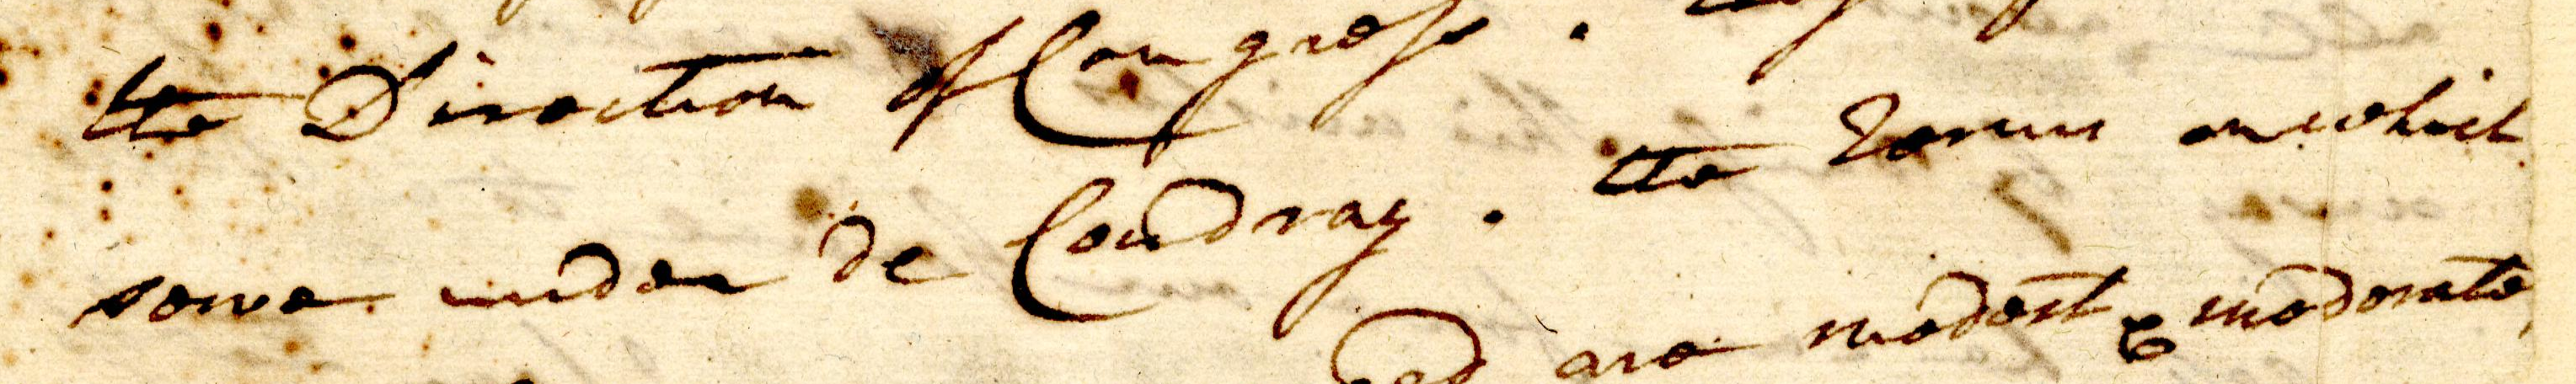serve under de Coudray. the Terms on which
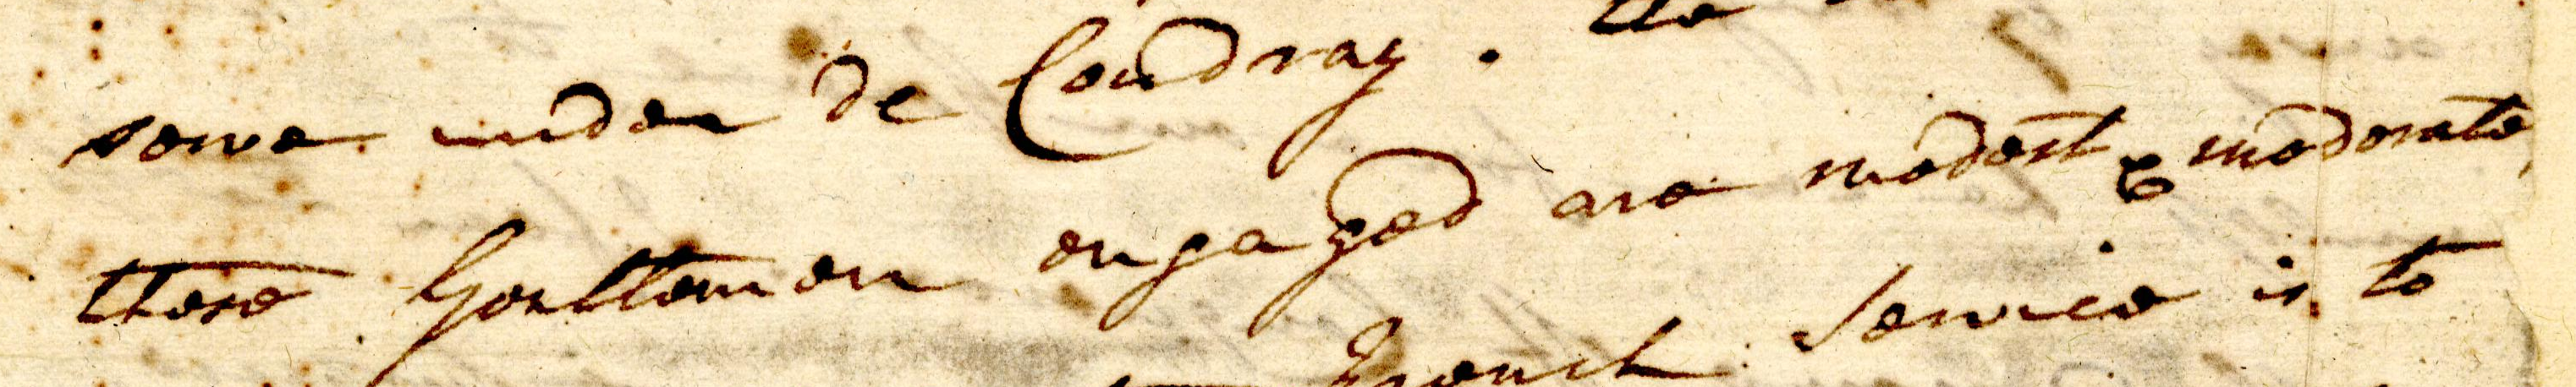these Gentlemen engaged are modest & inadequate
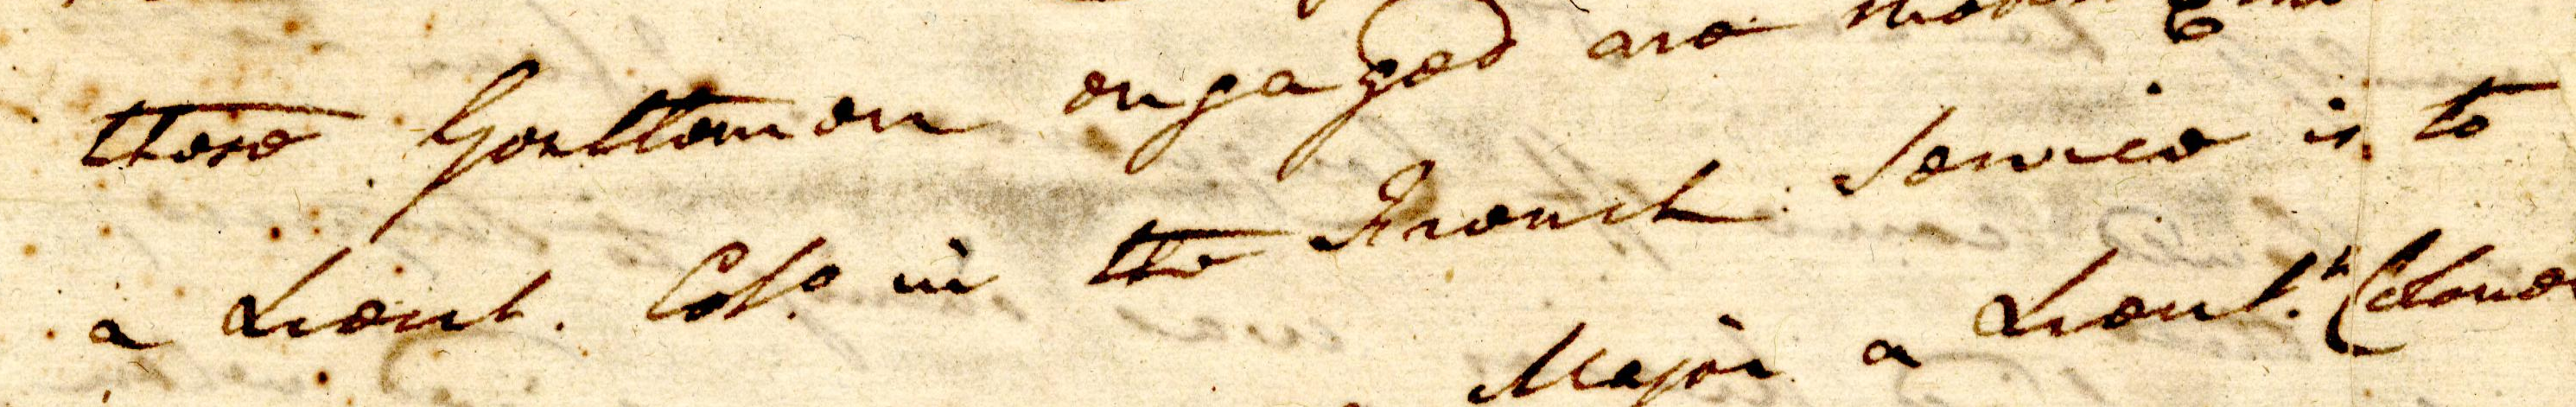a Lieut. Col^o. in the French service is to
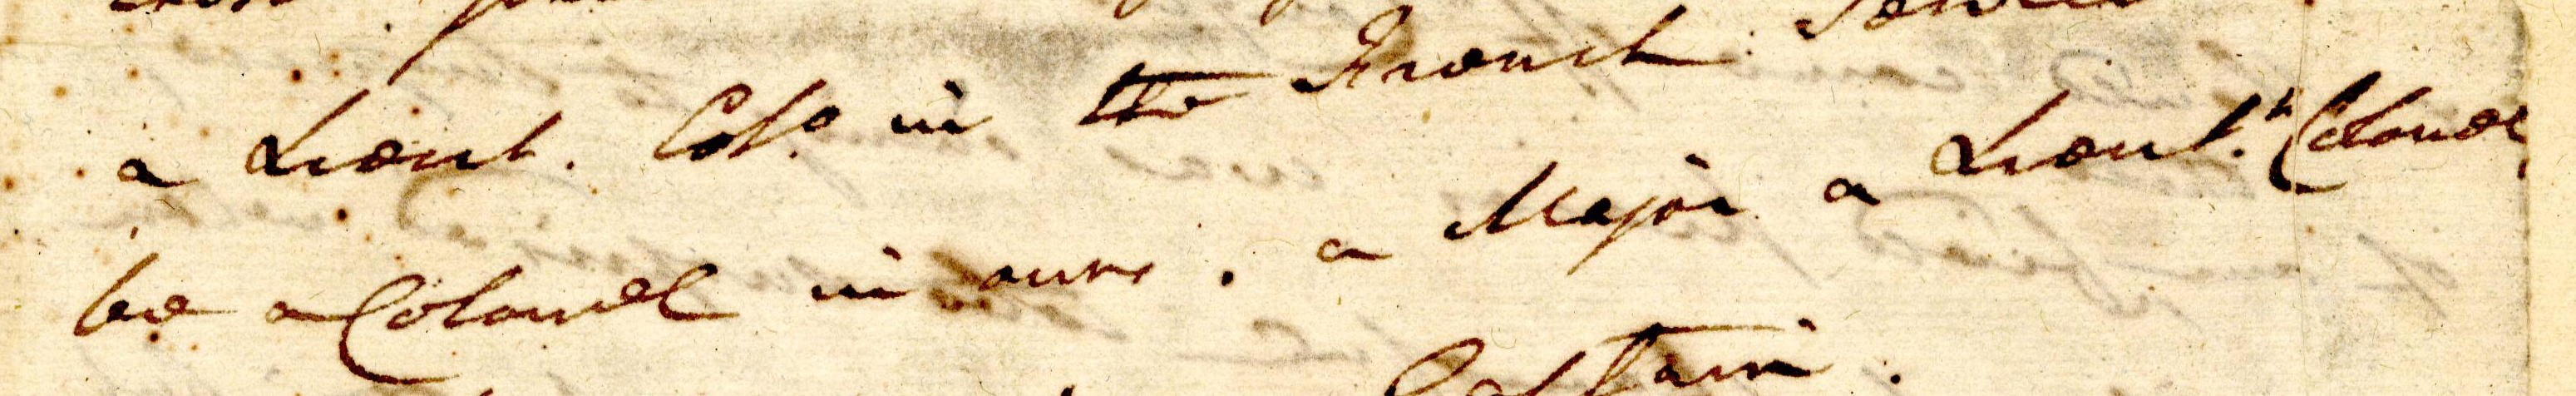be a Colonel in ours. a Major a Lieut Colonel
